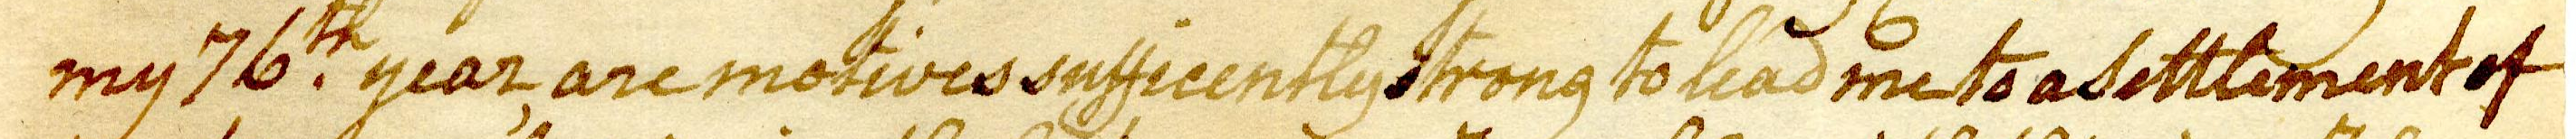my 76^th. year, are motives sufficently strong to lead me to a settlement of
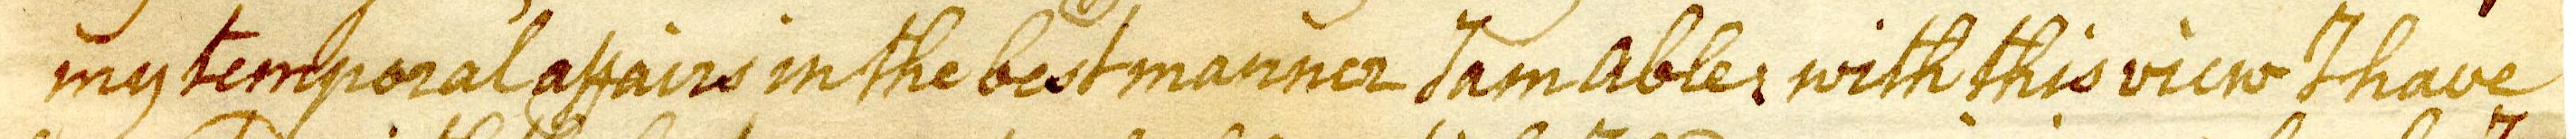my temporal affairs in the best manner I am Able, with this view I have
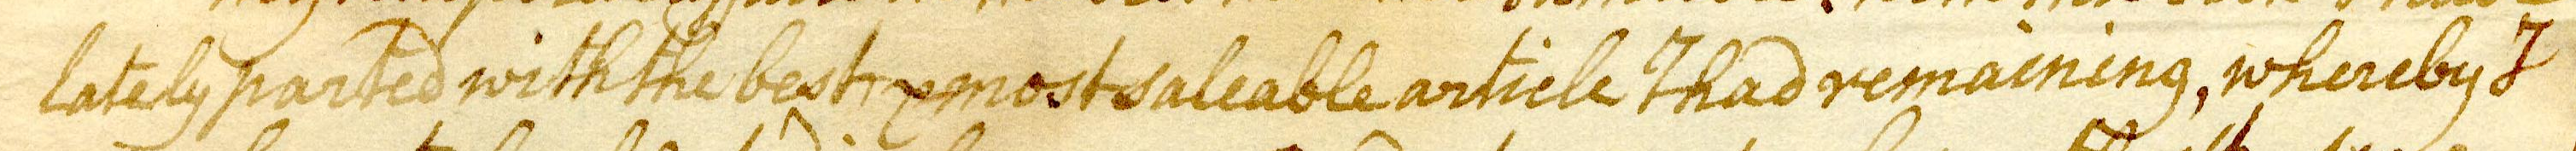lately parted with the best & most saleable article I had remaining, whereby I
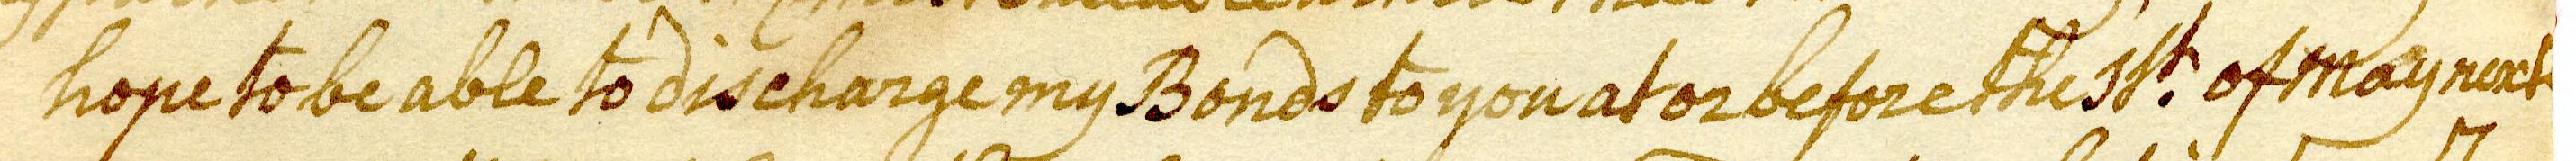hope to be able to discharge my Bonds to you at or before the 18^th. of May next
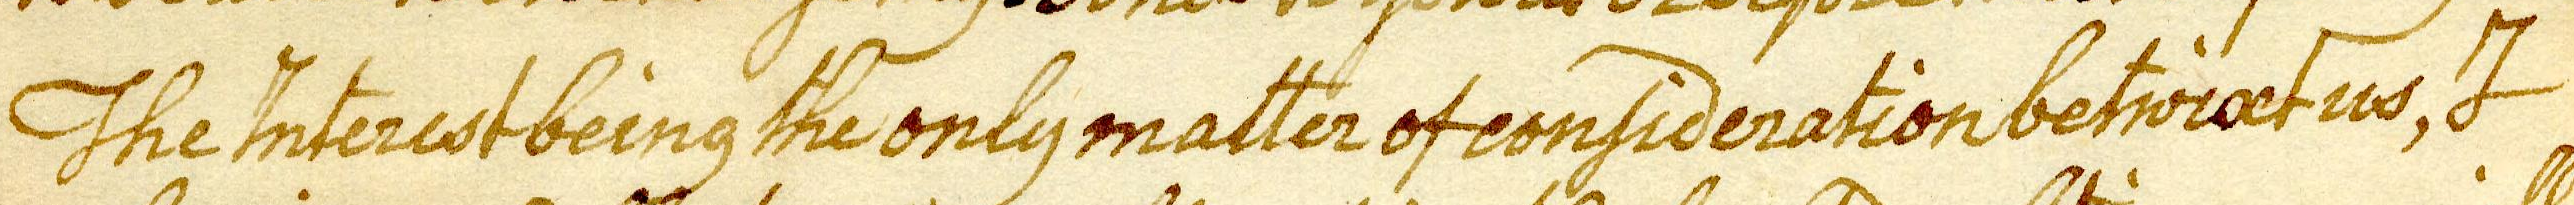The Interest being the only matter of consideration betwixt us, I
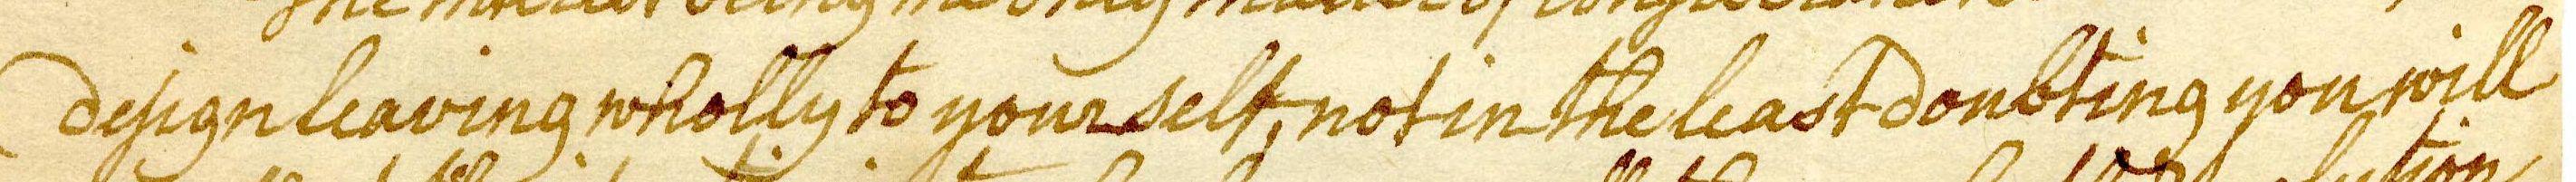design leaving wholly to yourself, not in the least doubting you will
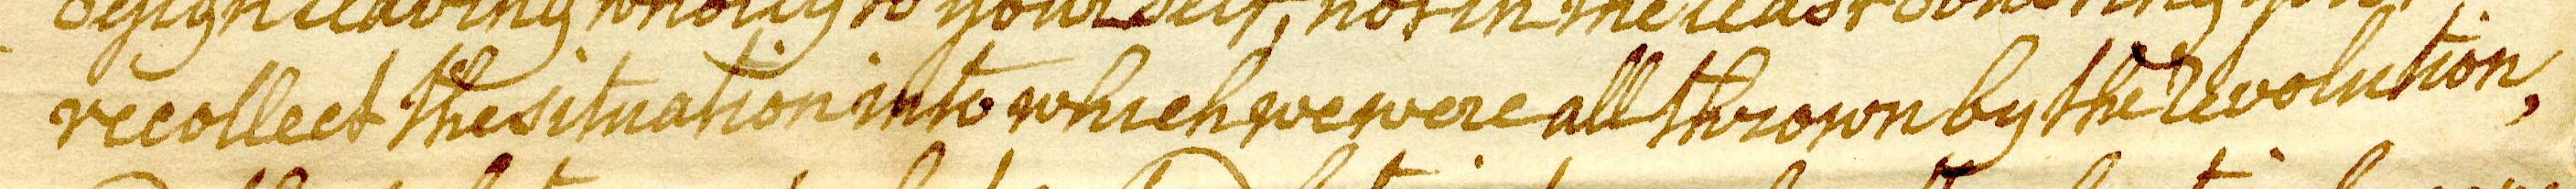recollect the situation into which we were all thrown by the revolution,
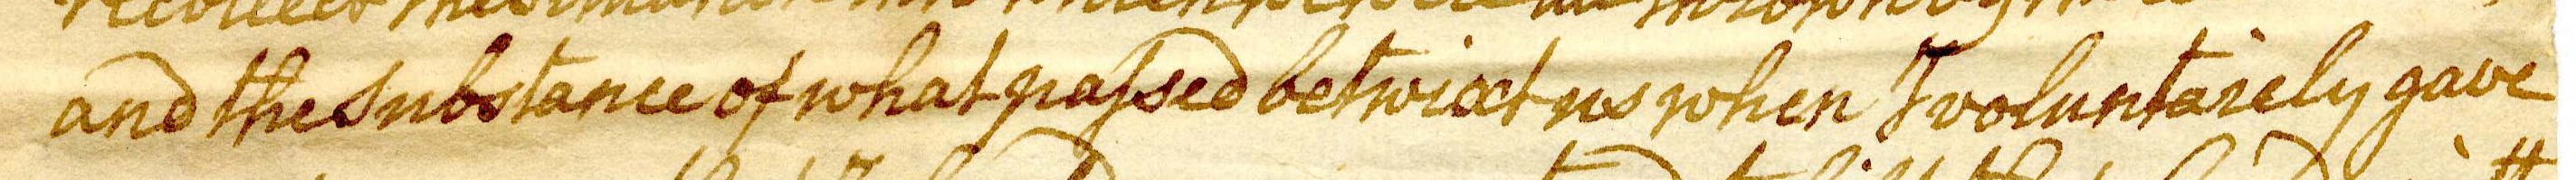and the Instance of what passed betwixt us when I voluntarily gave
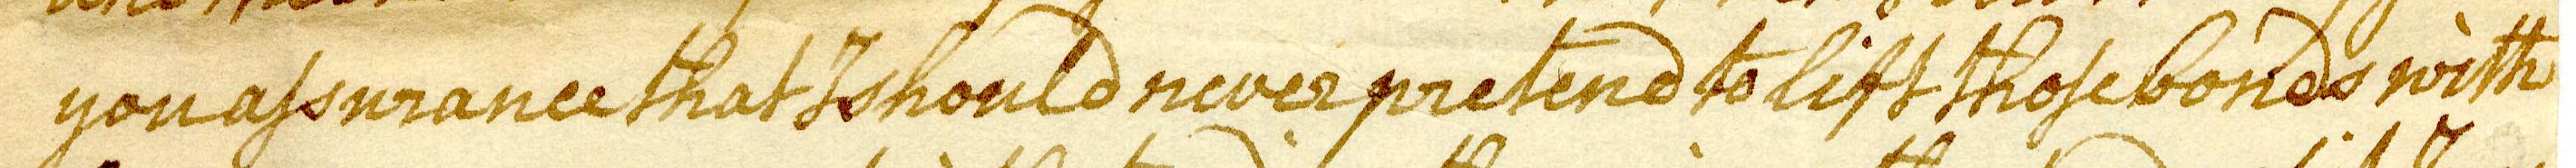you assurance that I should never pretend to lift those bonds with
